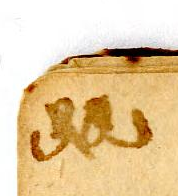30
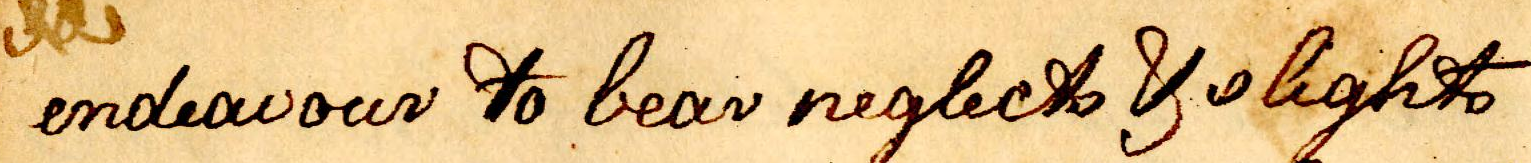endeavour to bear neglects & slights
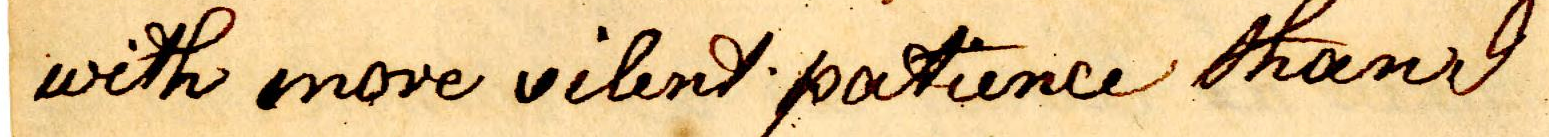with more silent patience than I
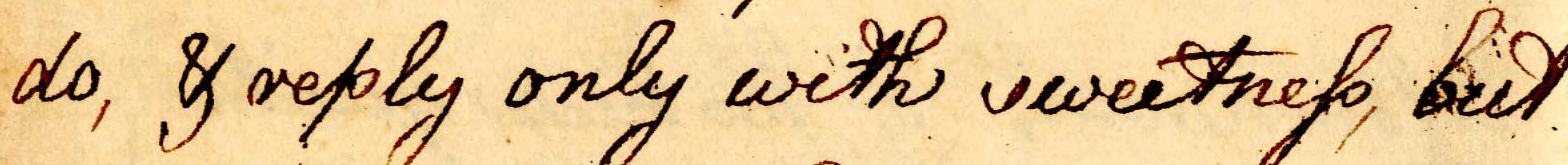do, & reply only with sweetness, but
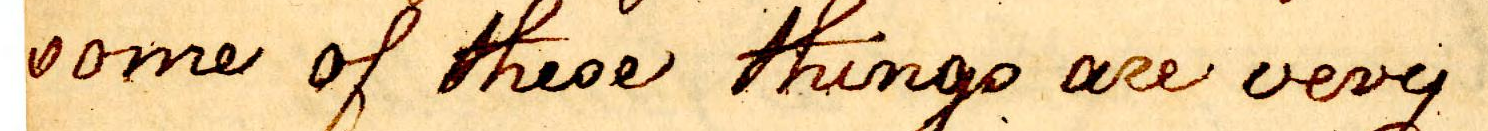some of these things are very
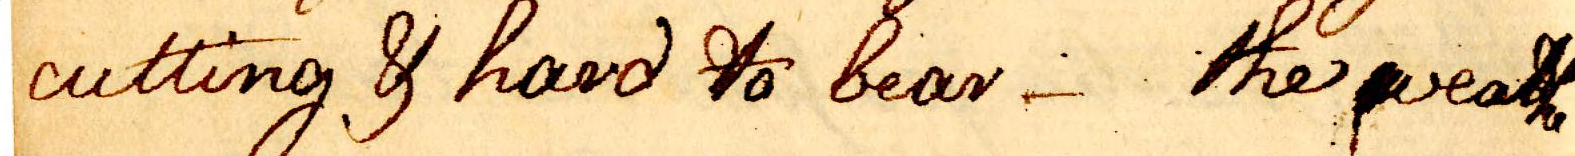cutting & hard to bear- the weathe
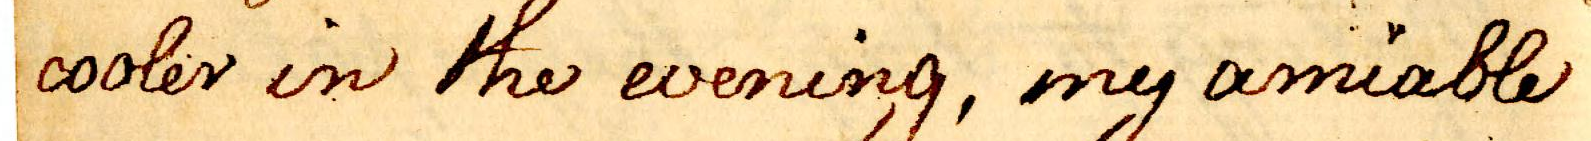cooler in the evening, my amiable
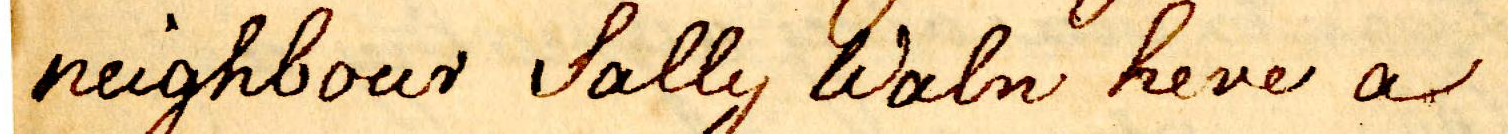neighbour Sally Waln here a
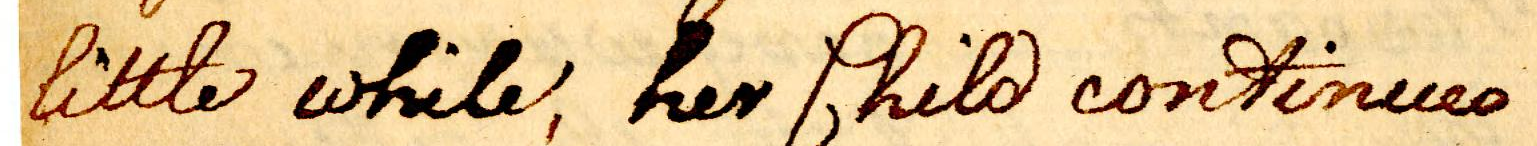little while, her Child continues
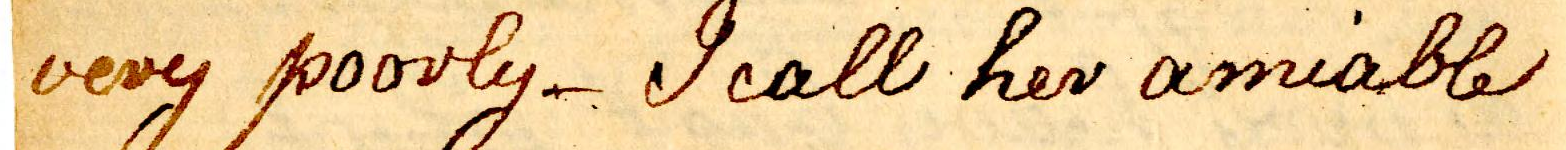very poorly- I call her amiable
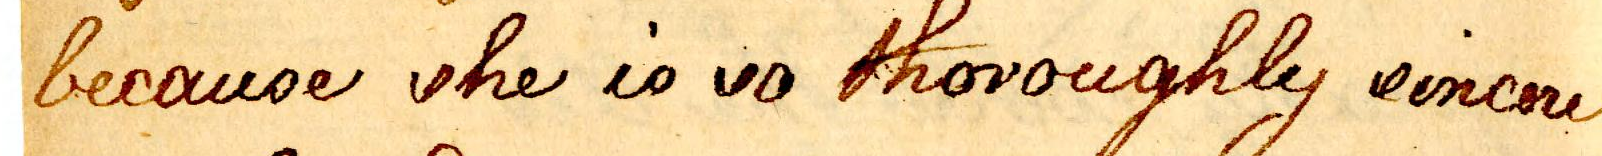because she is so thoroughly sincere
